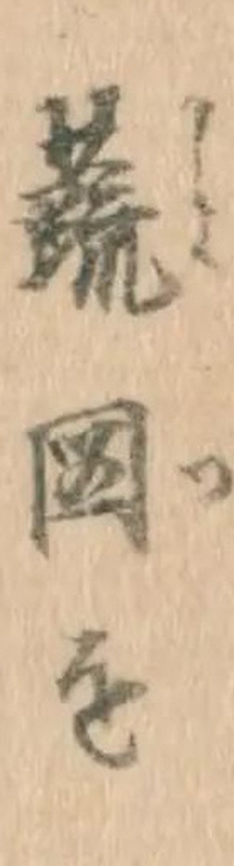蔬図を

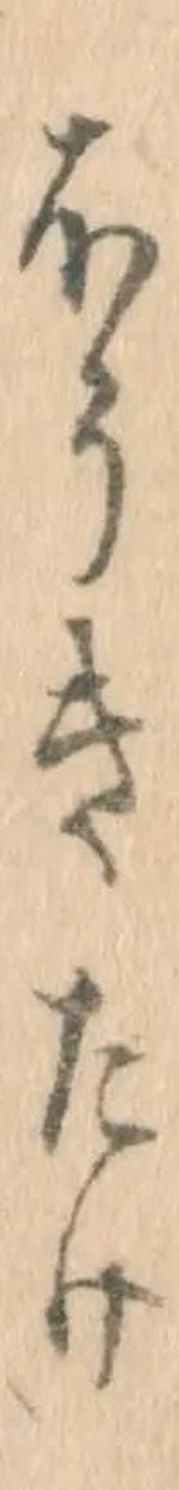ほうきたけ
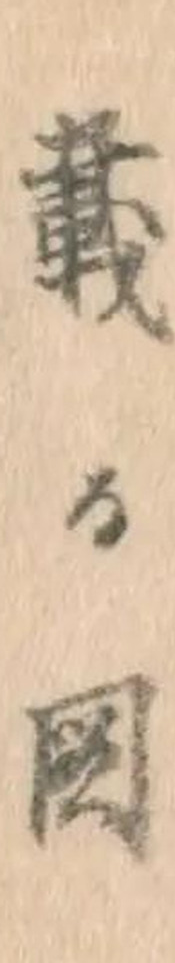載る図
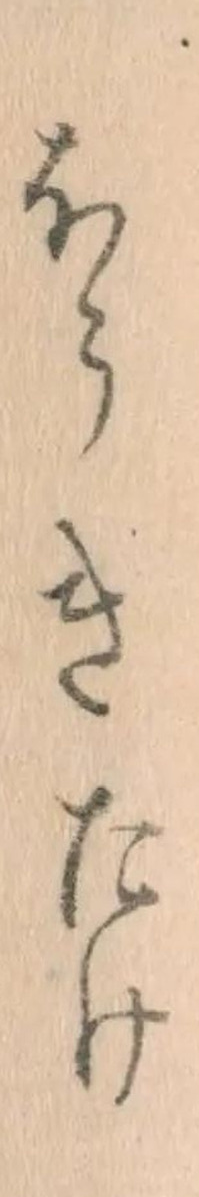ほうきたけ
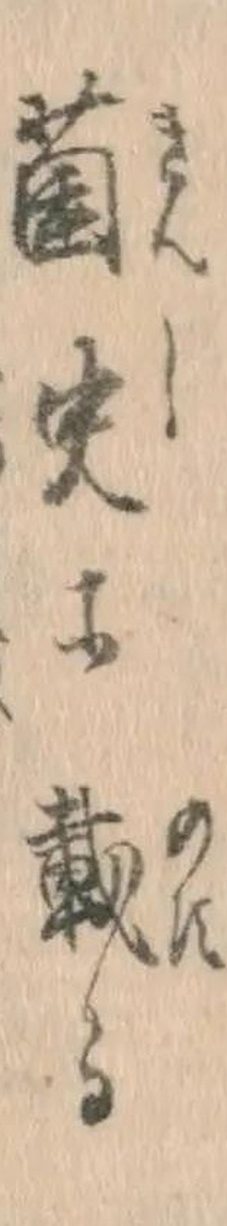菌史に載る
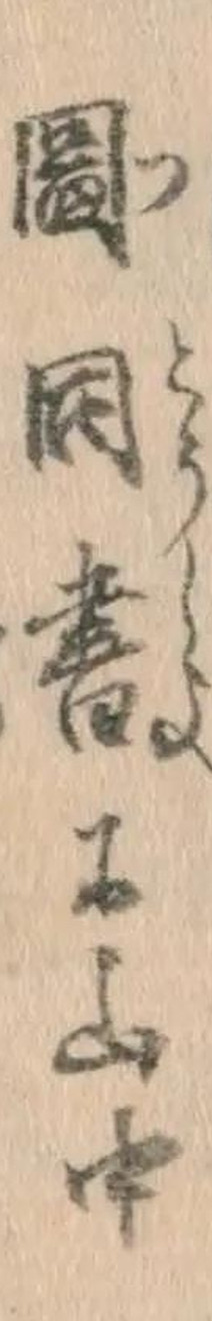図同書に山中
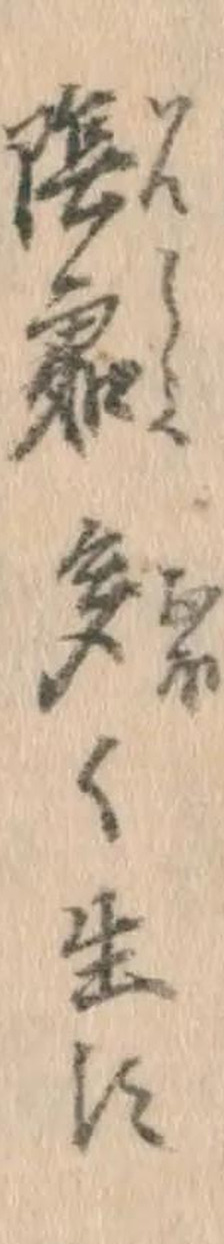陰処多く生す
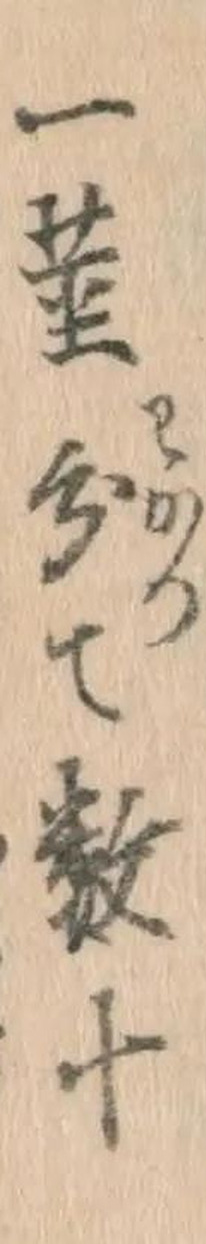一茎分て数十
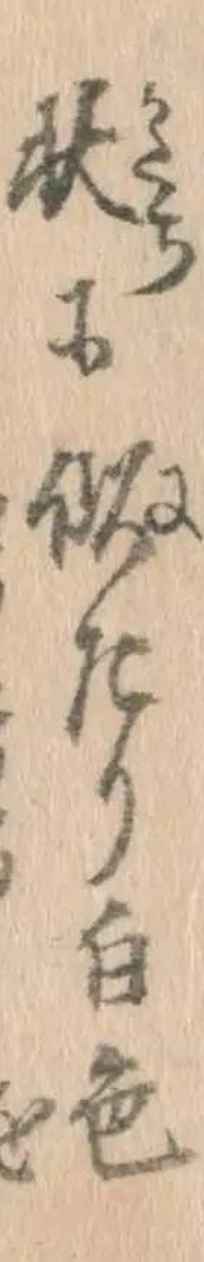状に似たり白色
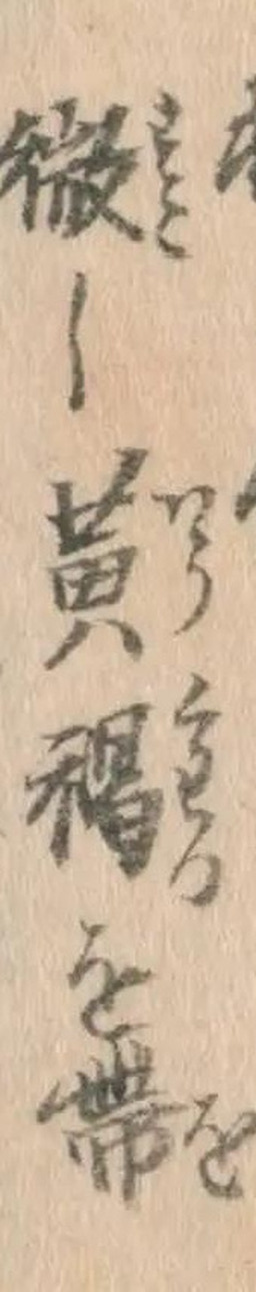微し黄褐を帯
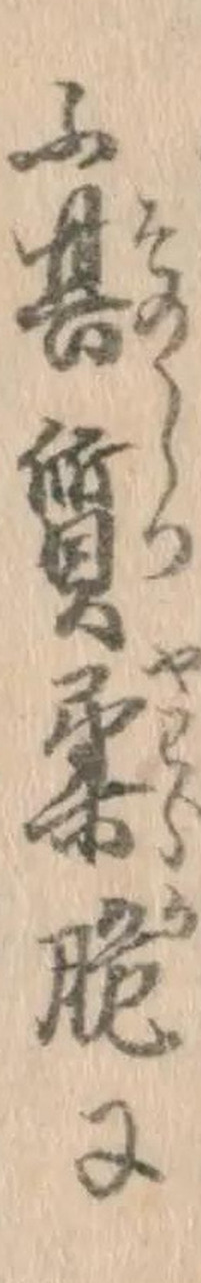ふ其質柔脆に
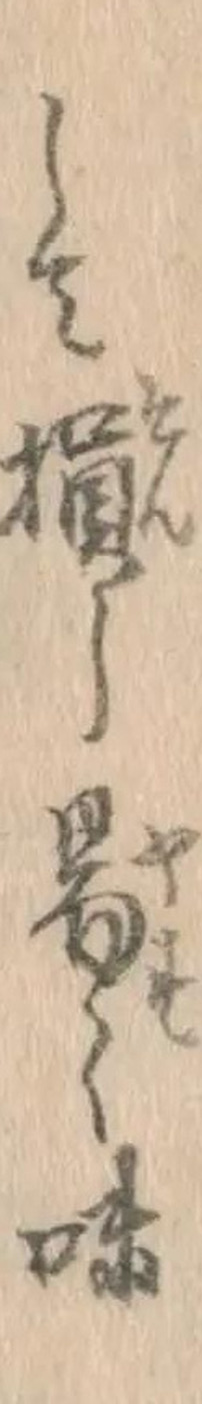して損し易く味
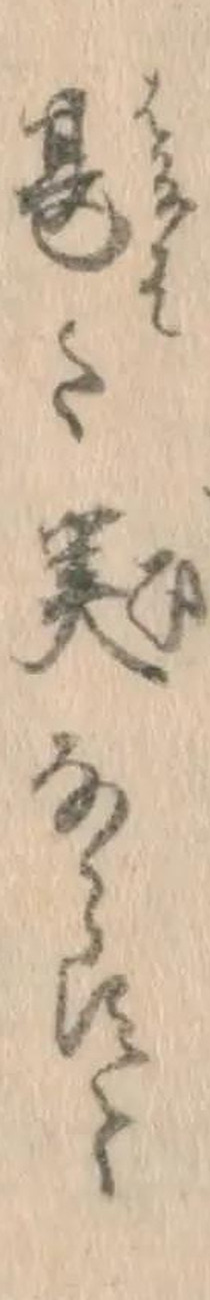甚た美ならすと
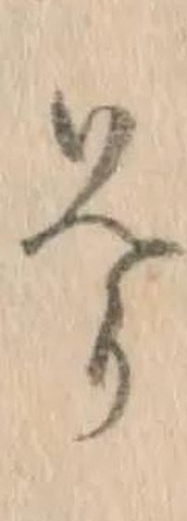いへり

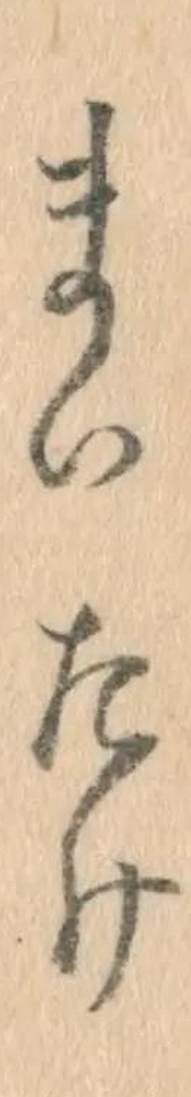まいたけ
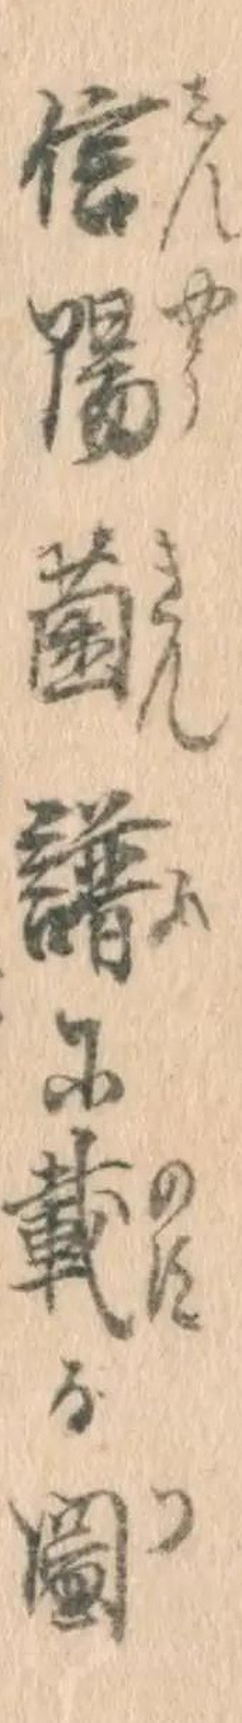信陽菌譜に載る図
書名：本草図譜. 巻58-60
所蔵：国立国会図書館 National Diet Library, JAPAN
